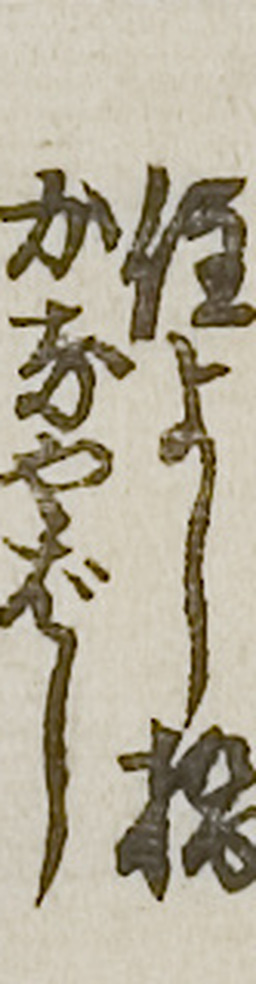かなやばし
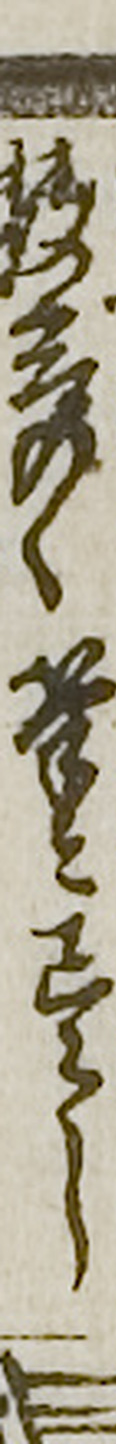数多候筆に尽し
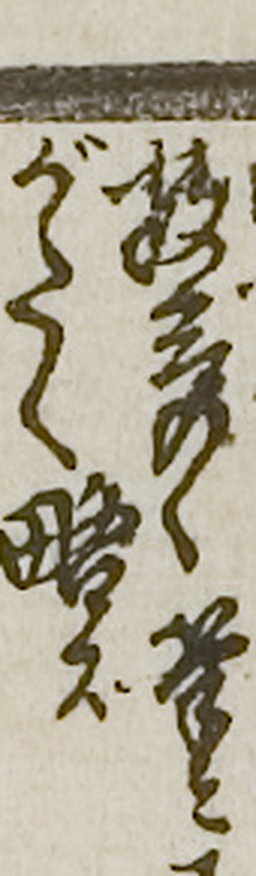がたく略す
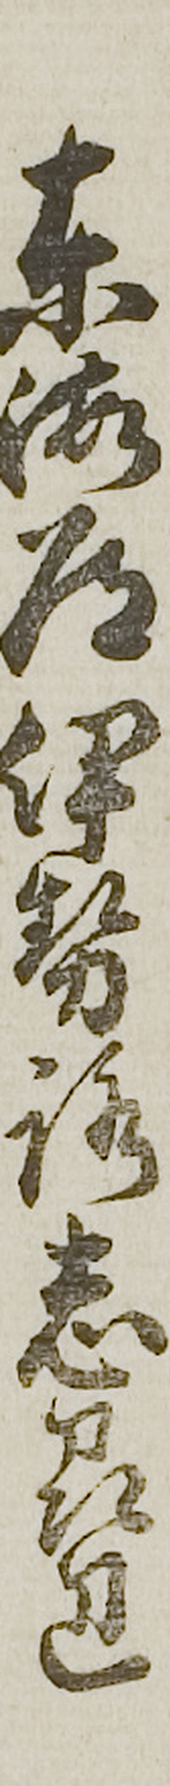東海道伊勢路志州辺
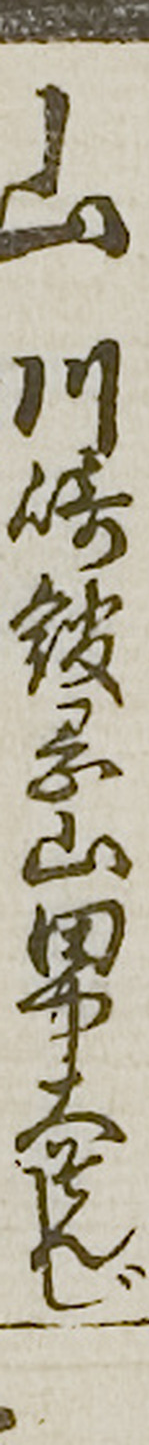山田川崎館岡山田中大そんじ
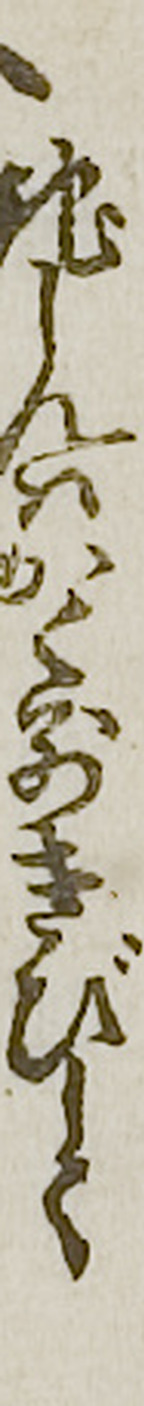宮地しんはかく別きびしく
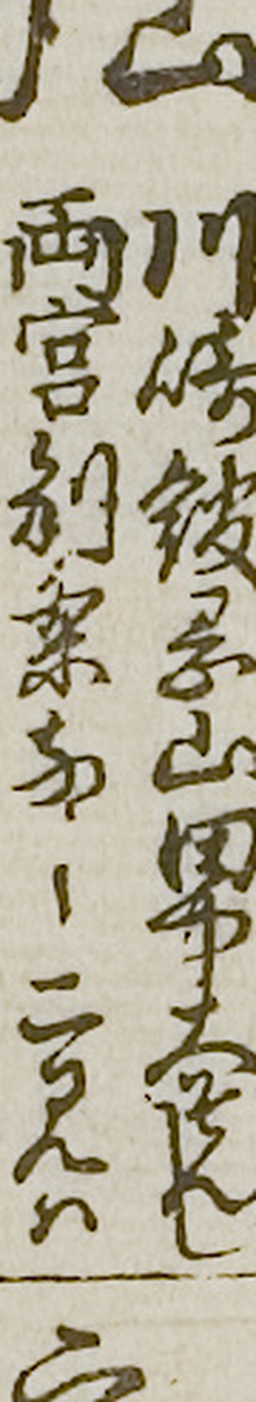両宮別条なし二見は
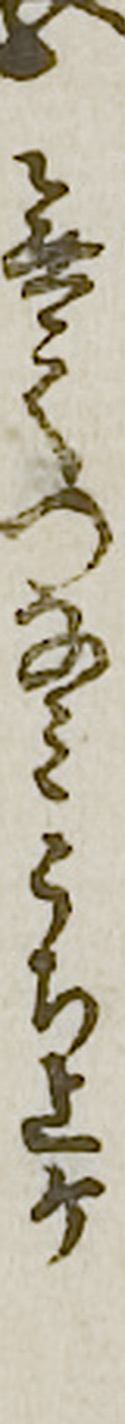無之つなみうち上け
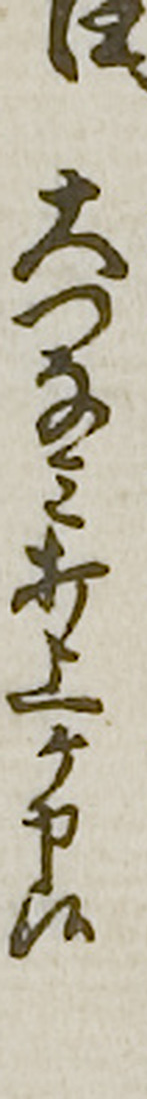大つなみ打上け申候
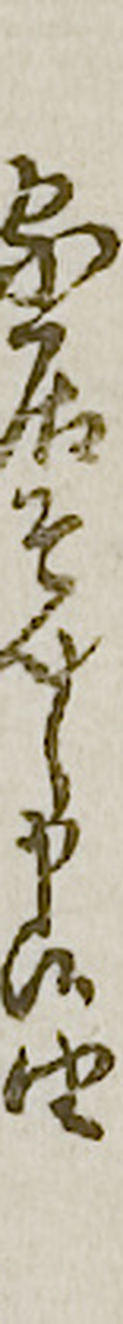家居そんし申候由
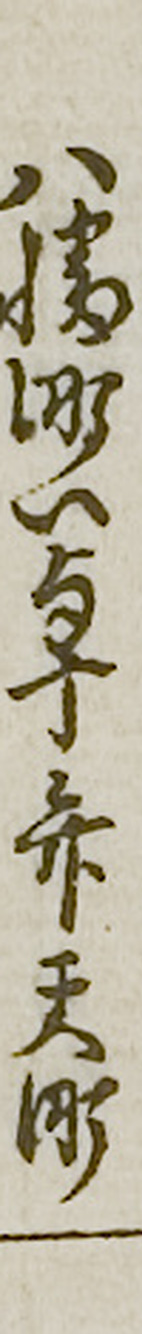津八幡町いと丁弁天丁
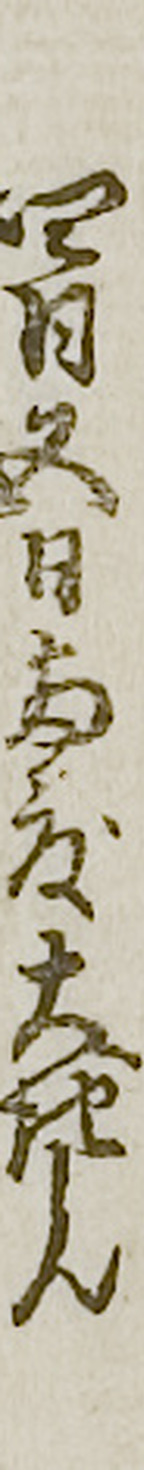桑名四月五日両度大地しん
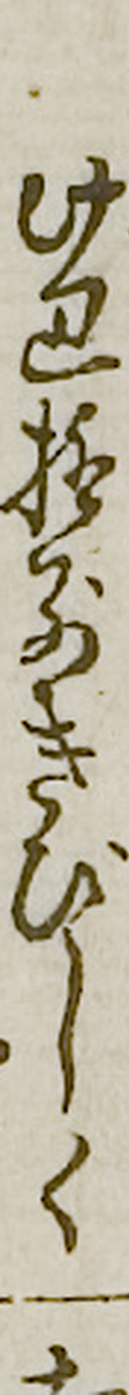此辺格別きびしく
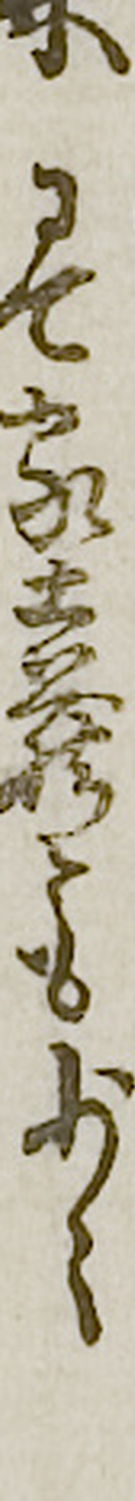にて家土蔵とも少々
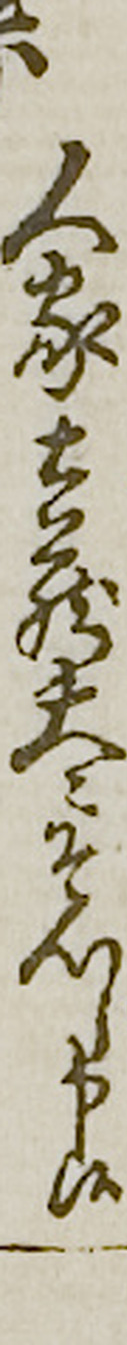人家土蔵大にそんじ申候
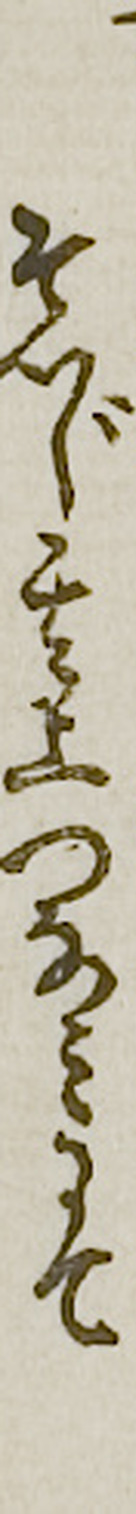そんじ其上つなみにて
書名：大坂辺東海道本しらべ大地震津波図
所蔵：東京大学総合図書館 General Library in the University of Tokyo, JAPAN
